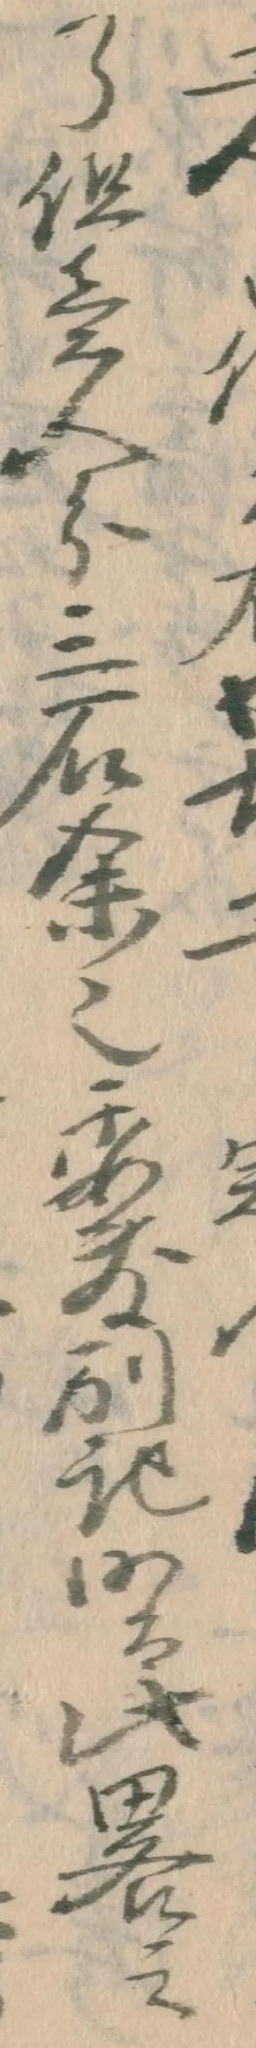了但壱人分三石余也委敷別記仍而此畧之
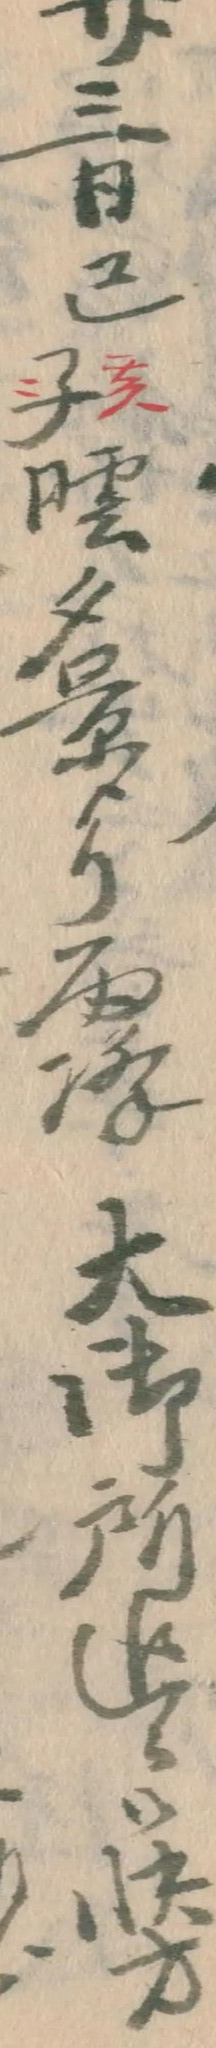廿三日己子曇夕景より雨降大御所追〻御快方
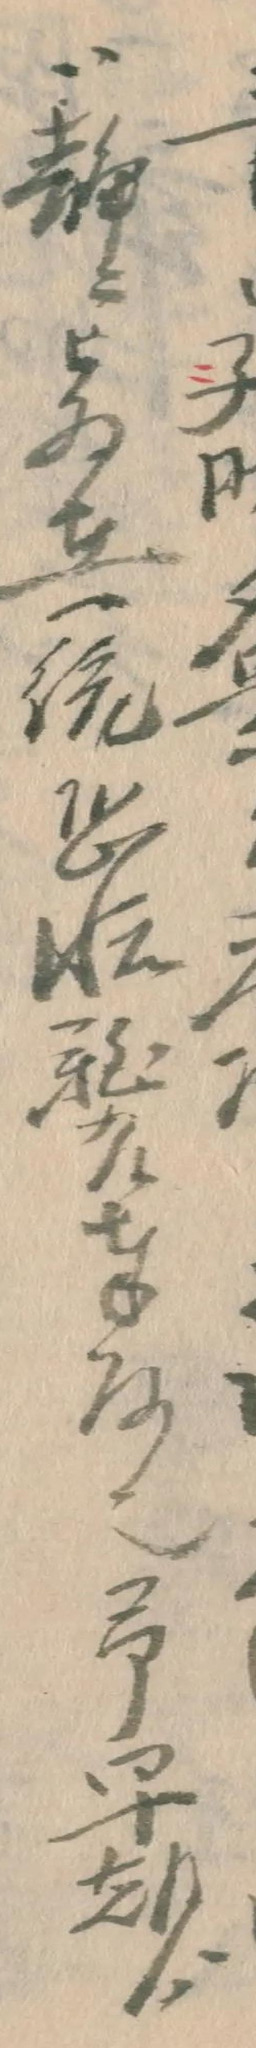御静ニ被為在一統恐悦難有奉存也予早朝ゟ
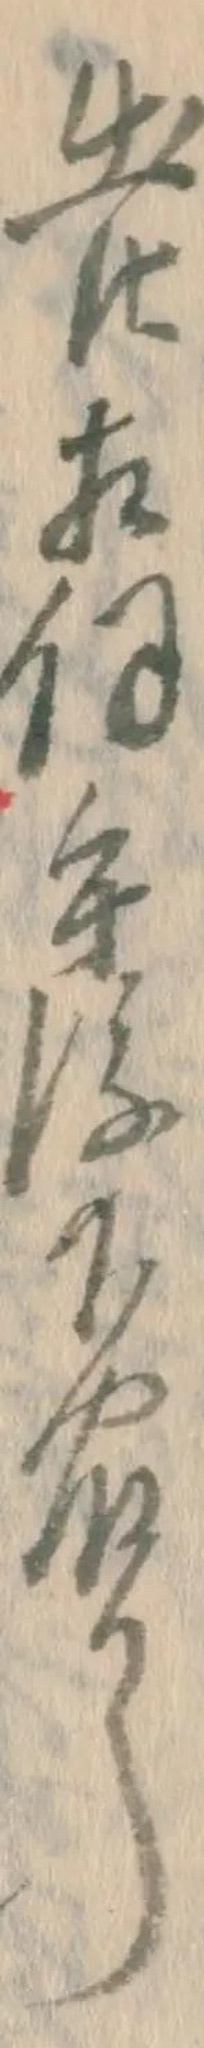出仕相伺午後下宿了
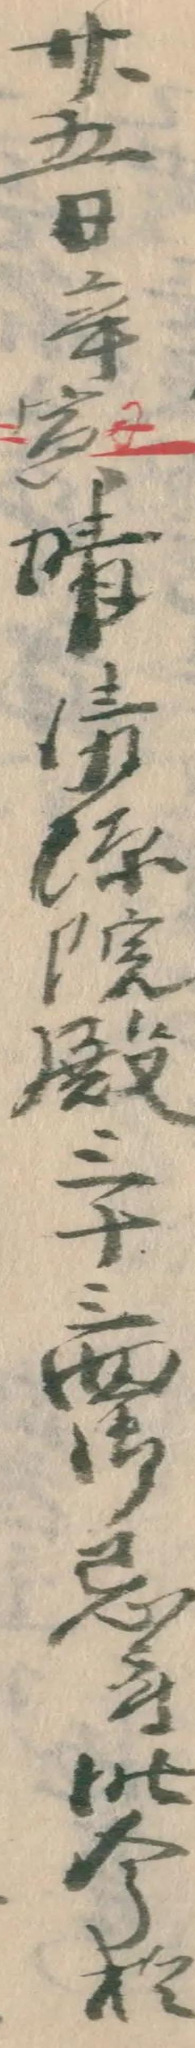廿五日辛亥晴清源院殿三十三回御忌ニ付昨今於
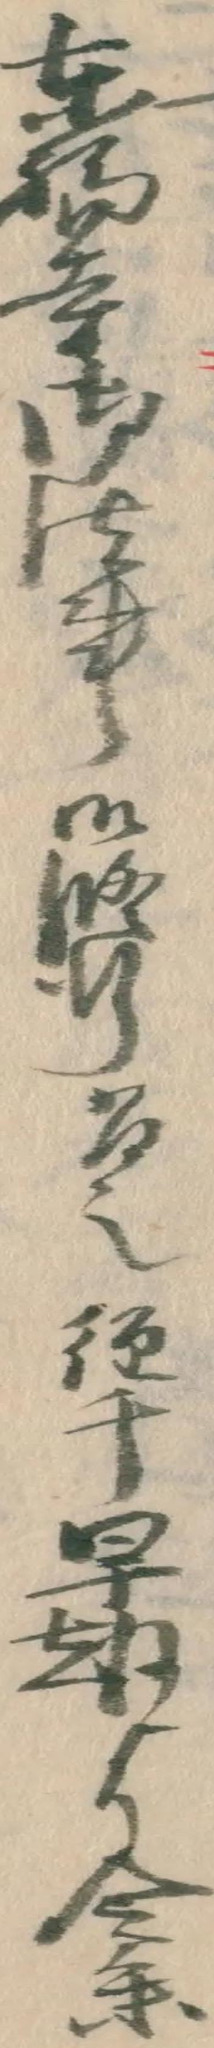東福寺御法事御修行有之経千早朝より令参参
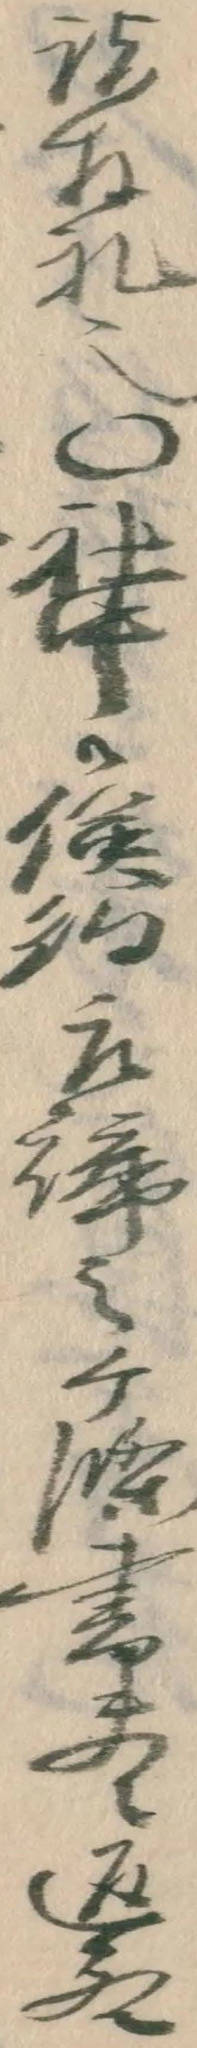詣拝礼也○社中御倹約取締之ケ条書夫々返答
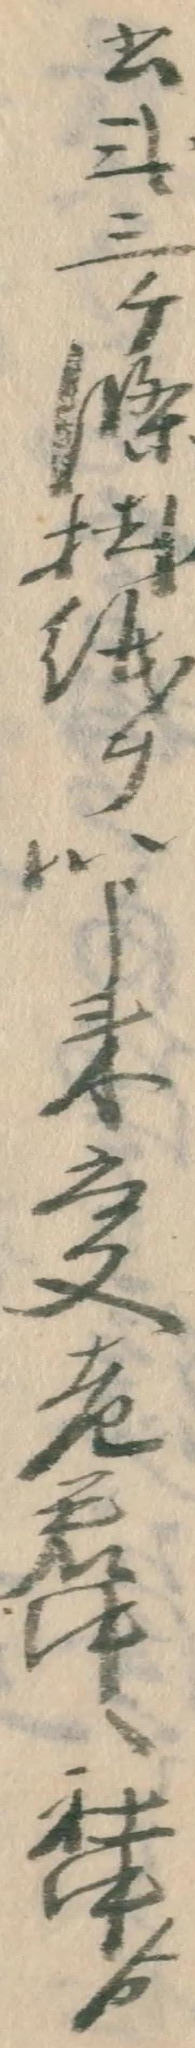書弐三ヶ條掛紙ヲ以申来尚又老若中へ社中ゟ
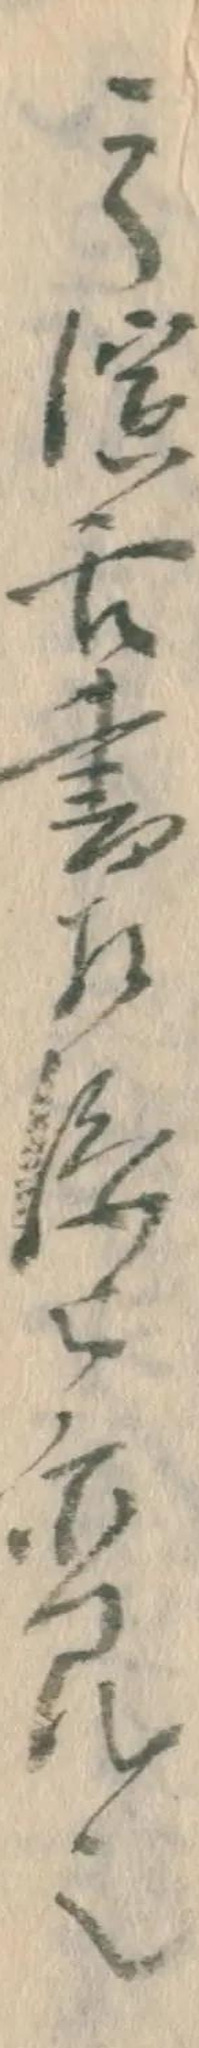之演舌書相添被尓見也
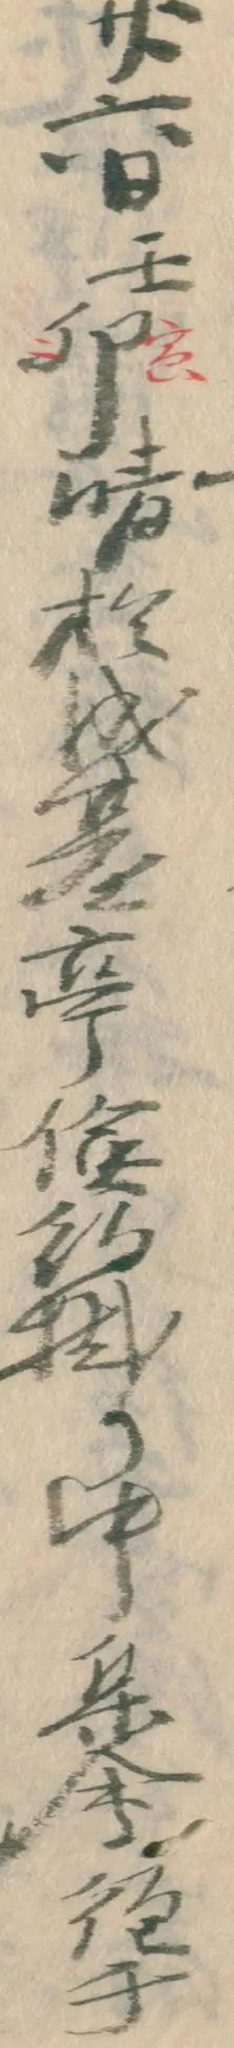廿六日壬卯晴於成基亭倹約掛り中集會経千
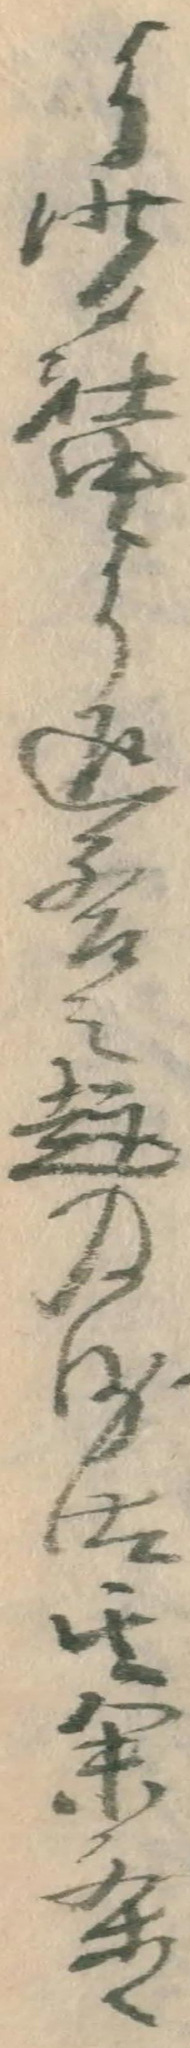より昨日社中より返答之趣及沙汰其余条へ

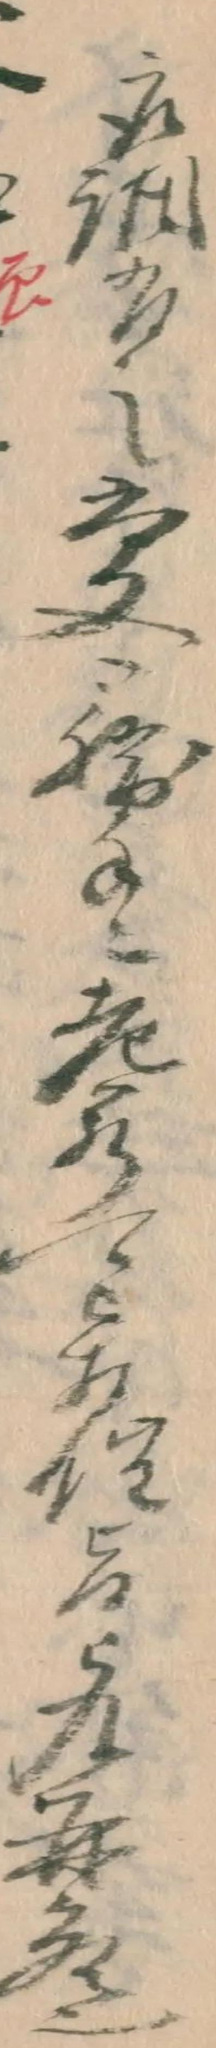取調有之尚又御勝手ニ老若可被相催旨被及再応也
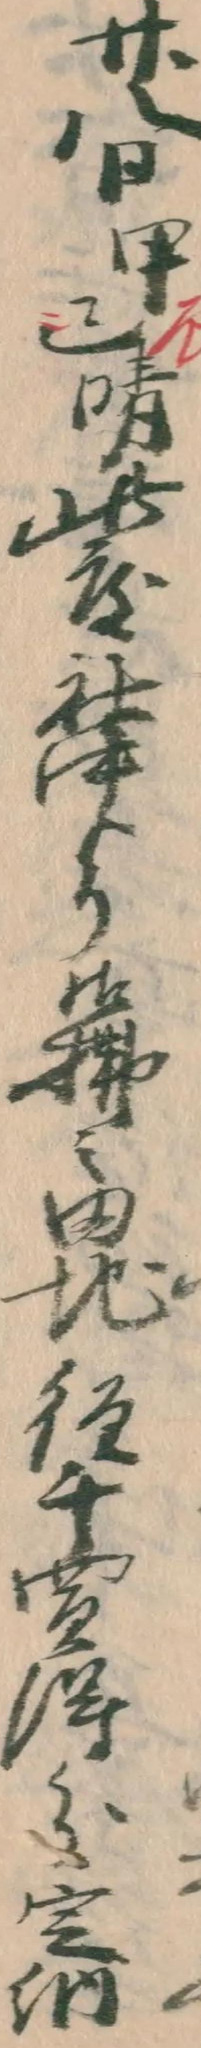廿八日甲巳晴此度社中より御払之田地経千買得分定納
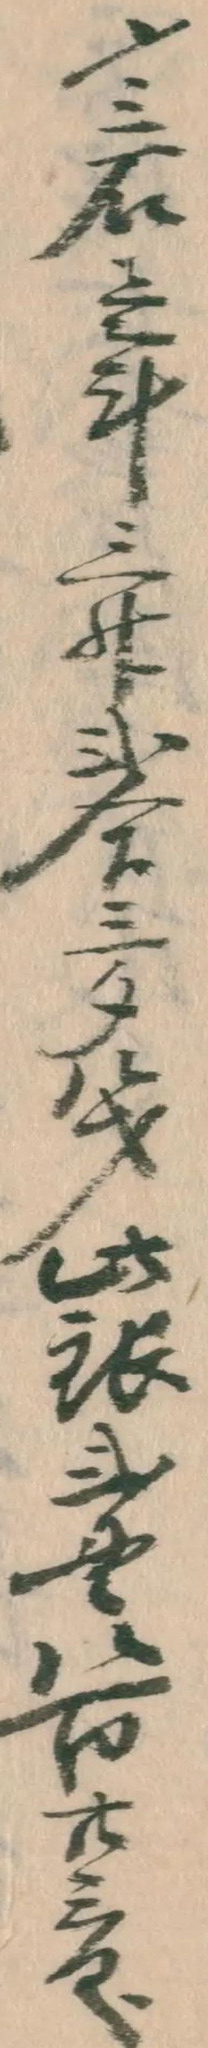〆三石壱斗三升弐合三夕八才此銀弐貫八百廿三匁
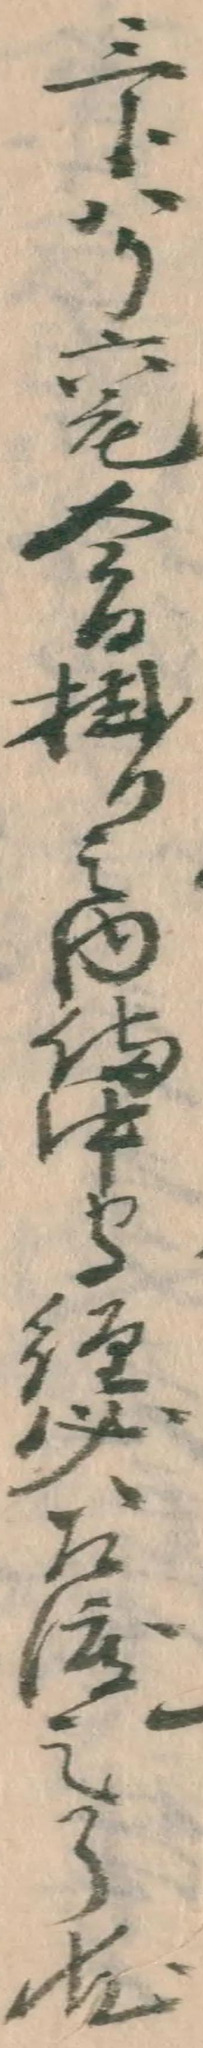三分八り六毛今日掛り之内備中守経必へ相渡之了尤
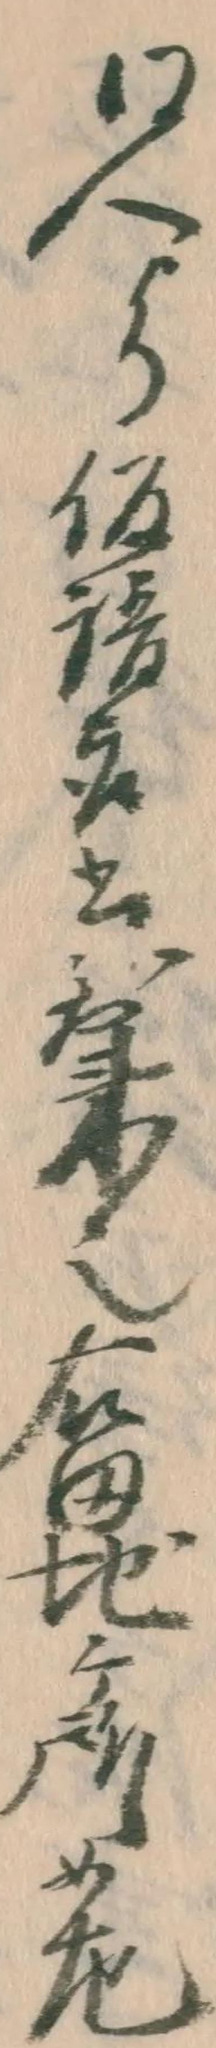同人より仮請取書到来也右田地ヶ所如左
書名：賀茂社記録. 第67冊
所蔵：国立国会図書館 National Diet Library, JAPAN
